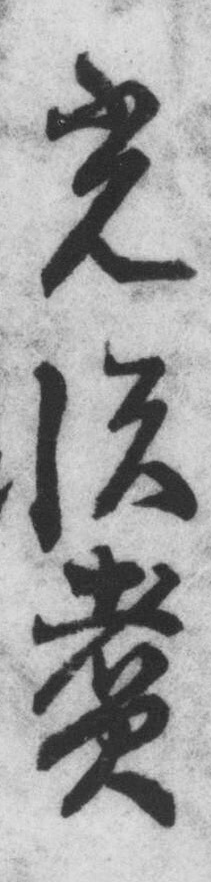光悦煮
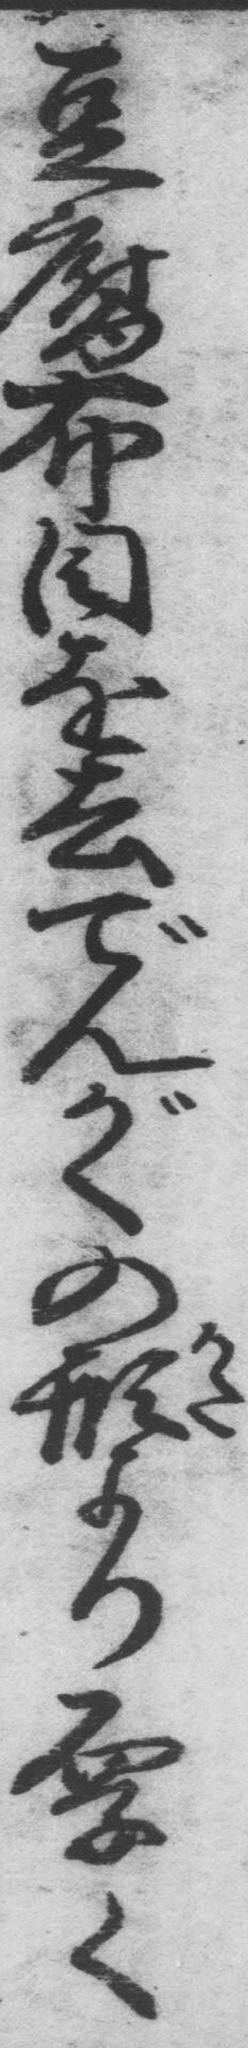豆腐布目を去でんがくの形より厚く
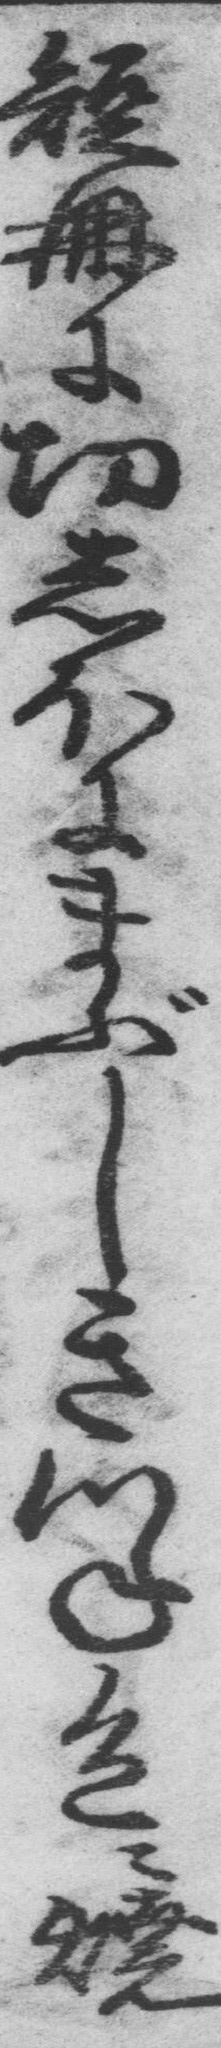短冊に切しほにまぶしきつね色に焼
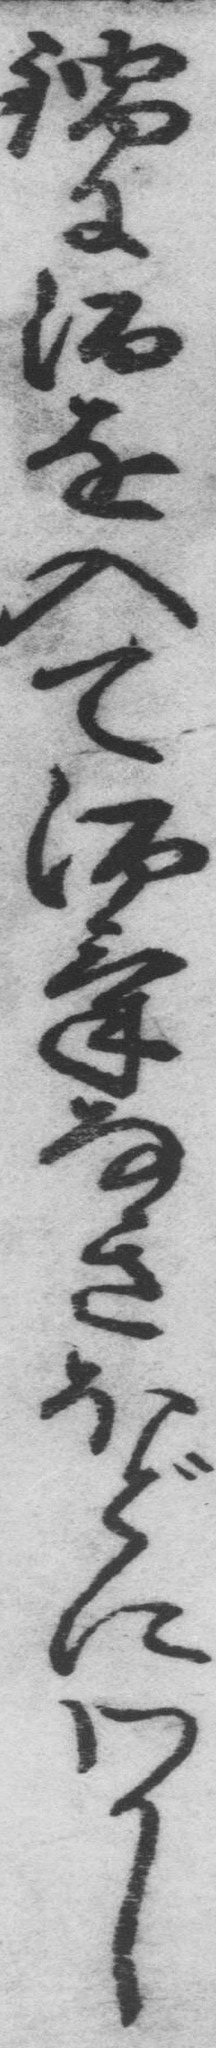鍋に酒を入て酒気なきほどにわかし
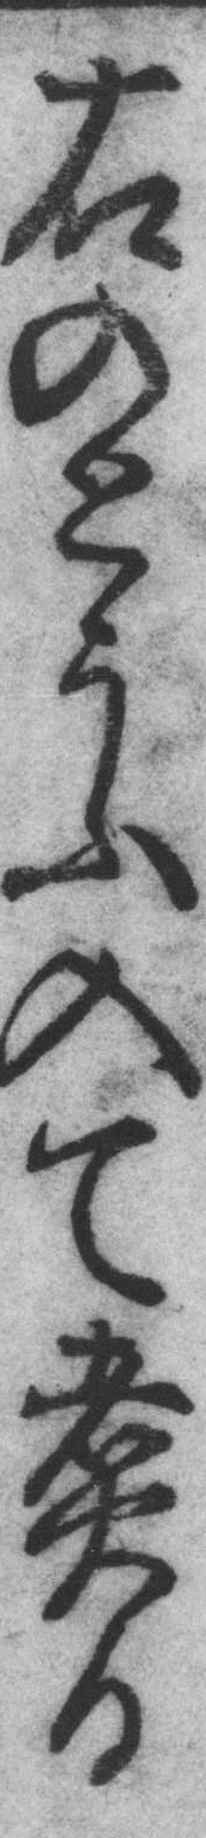右のとうふ入て煮る

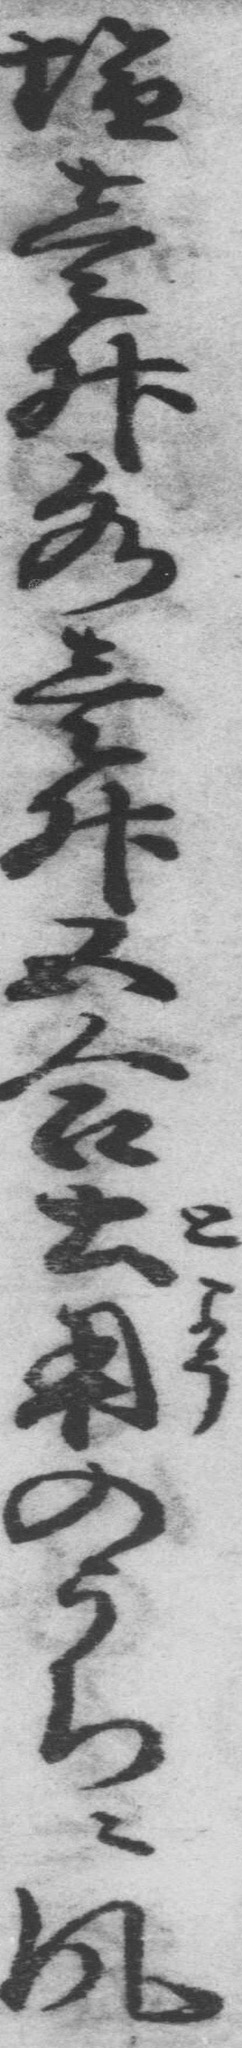塩壱升水壱升五合土用のうちに風
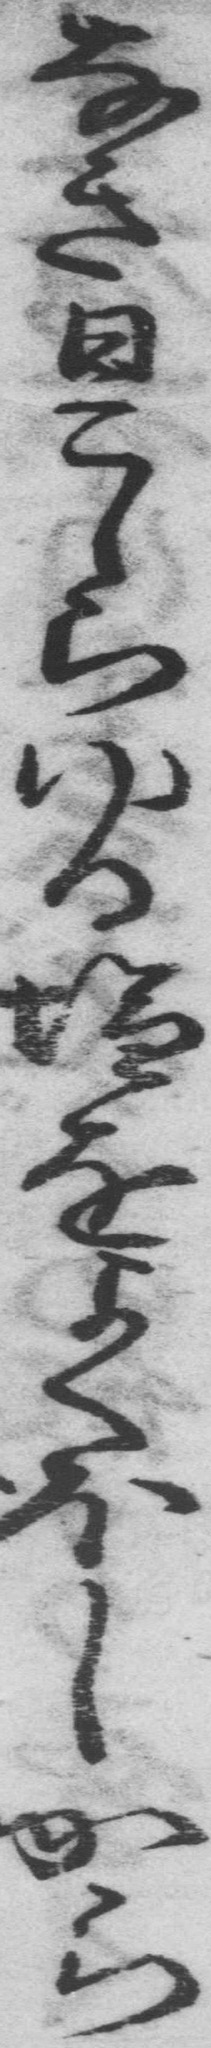なき日こしらゆる塩をよくほしから
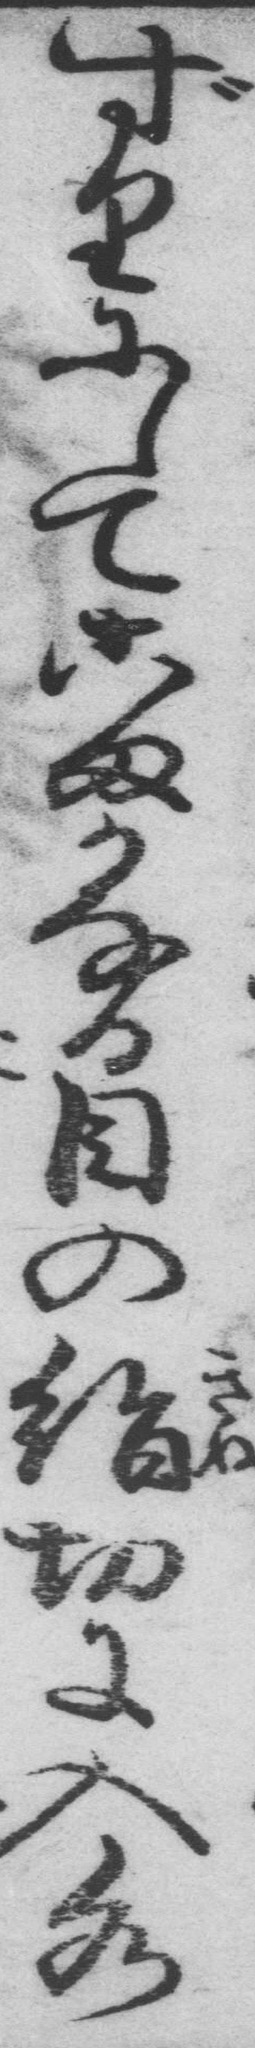ずりにしてこまかなる目の絹切に入水
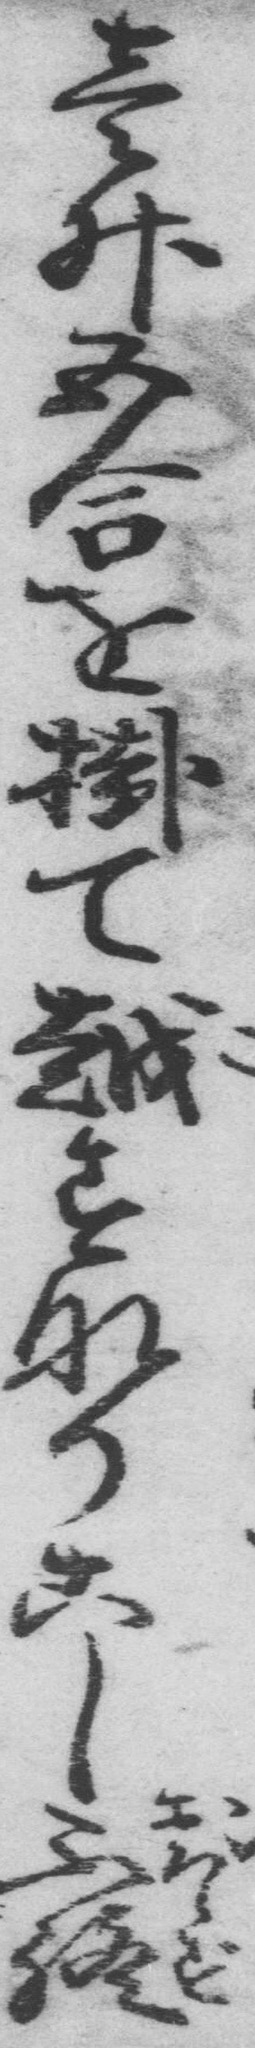壱升五合を掛て越すなりこし不終
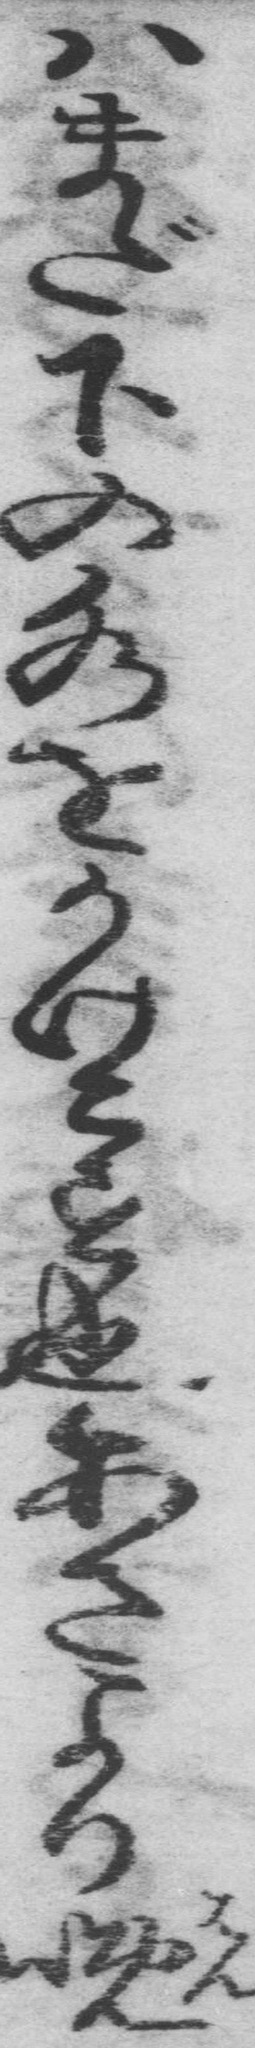はまだ下の水をかけこす也あさより晩
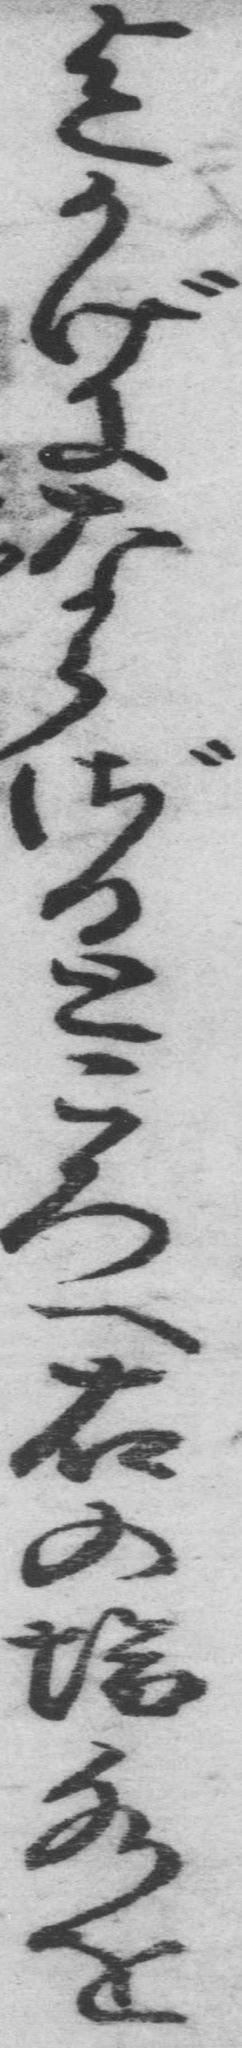迄かげにならざるところへ右の塩水を
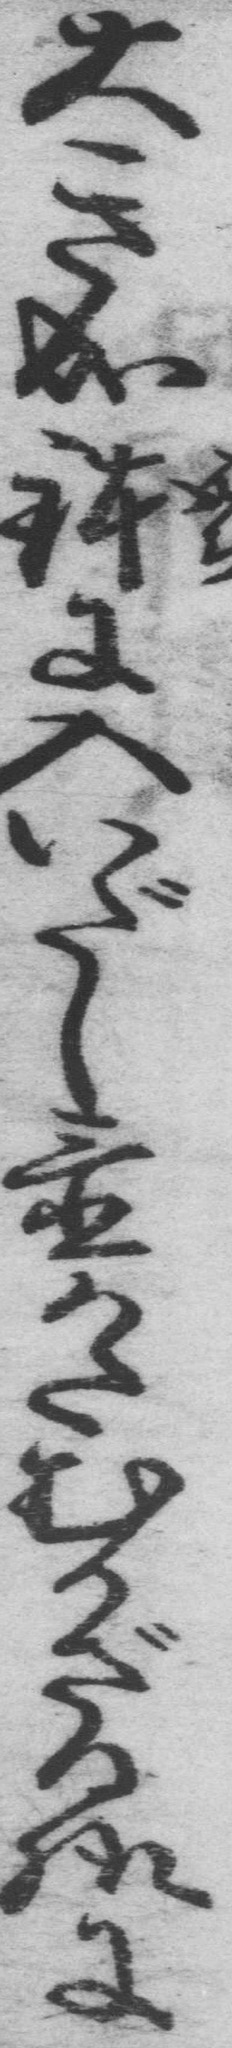大き成鉢に入いだし置かたむかざる様に
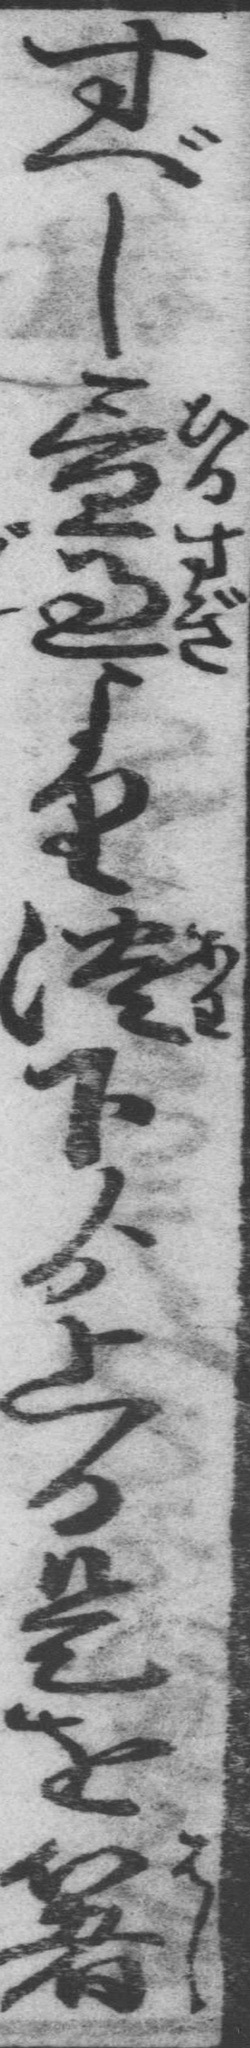すべし昼過より淡下ゟ上る是を箸
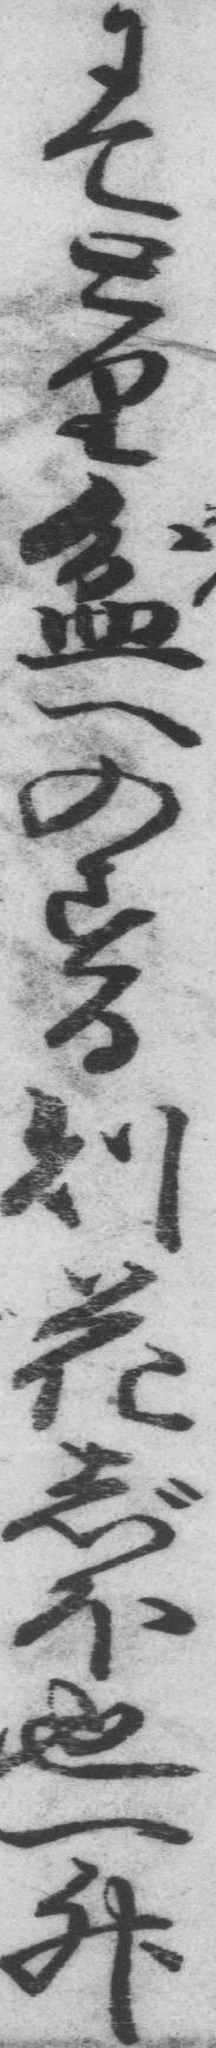にてとり盆へのする則花じほ也一升
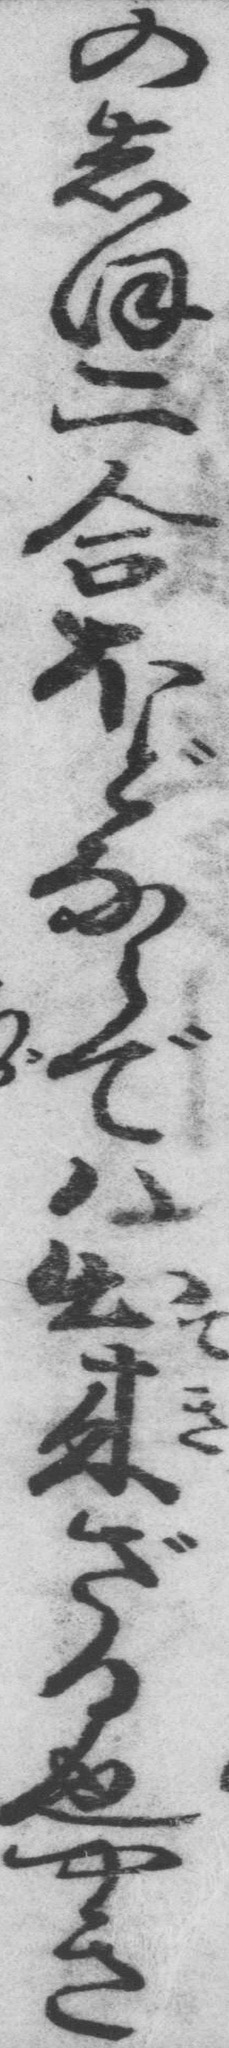のしほ二合ほどならでは出来ざる也やき
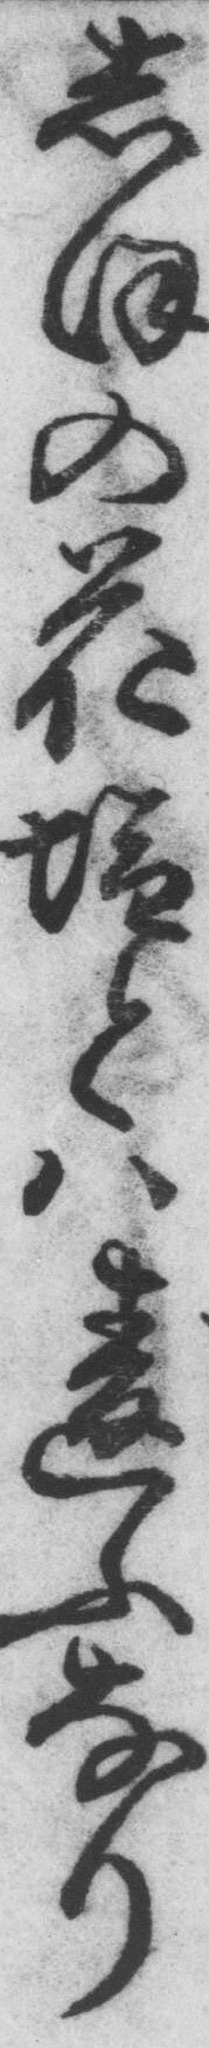しほの花塩とは違ふなり
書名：料理山海郷
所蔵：大阪府立大学学術情報センター 国文学研究資料館
